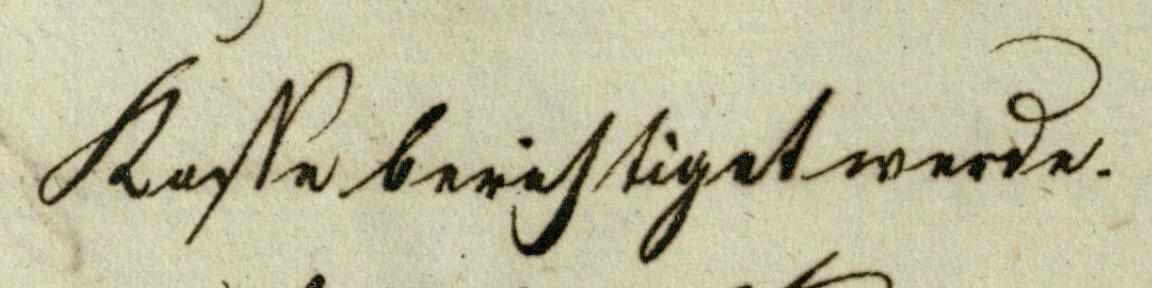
Kasse berichtiget werde.
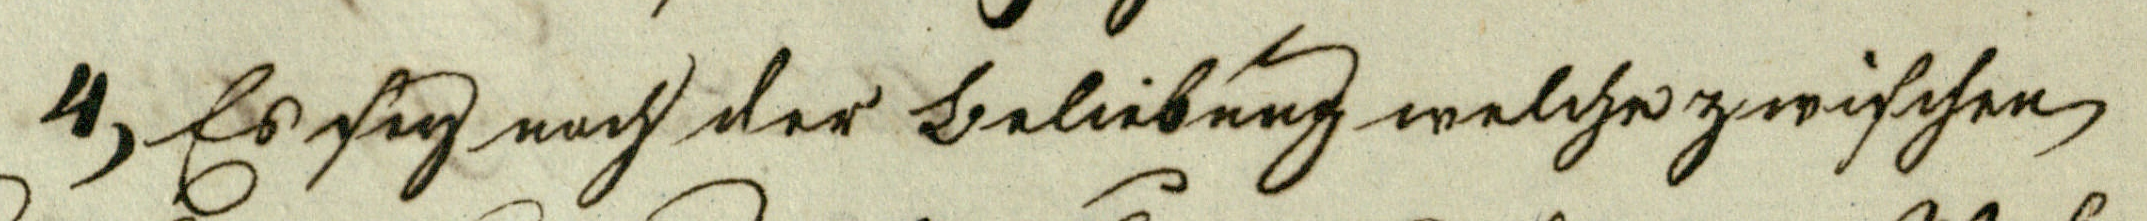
4, Es sey nach der Beliebung welche zwischen
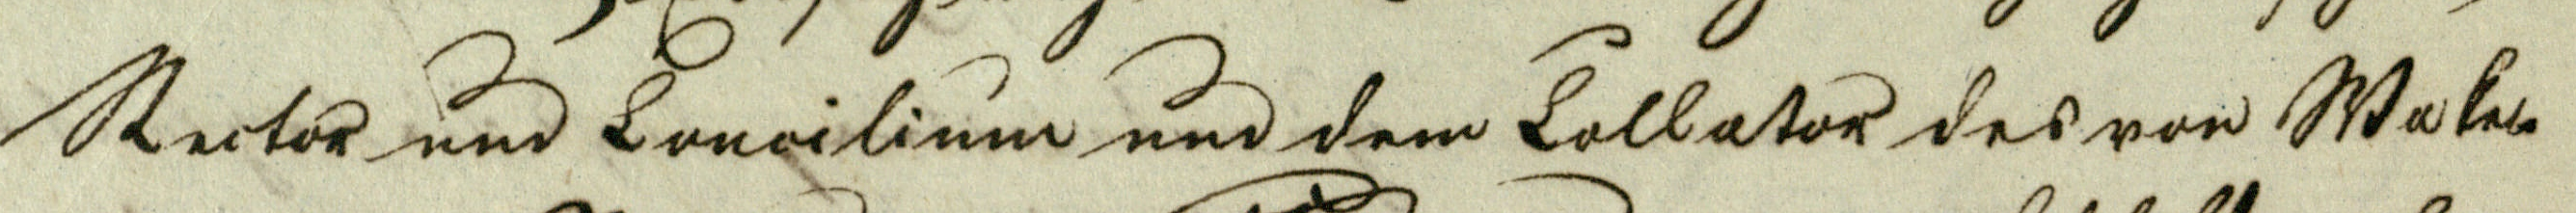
Rector und Concilium und dem Collator des von Wake¬
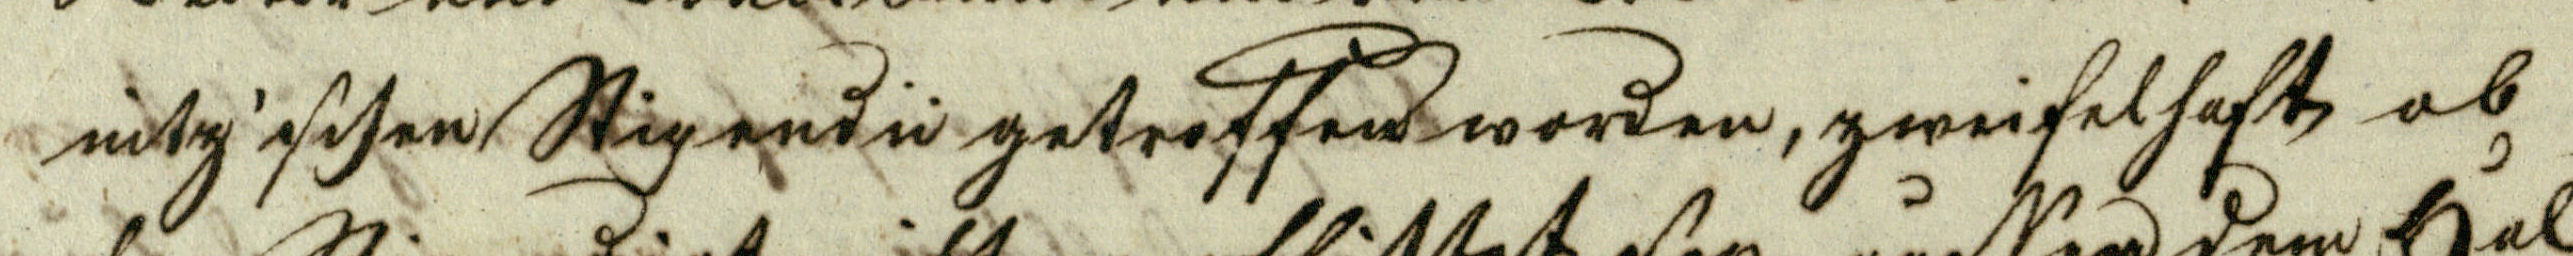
nitz'schen Stipendii getroffen worden, zweifelhaft ob
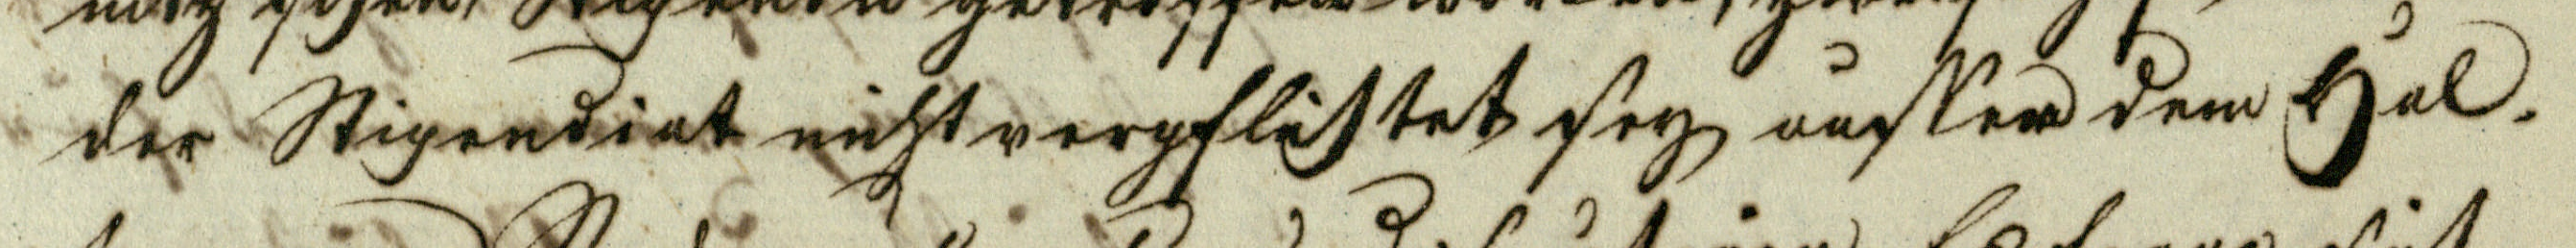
der Stipendiat nicht verpflichtet sey, ausser dem Hal¬
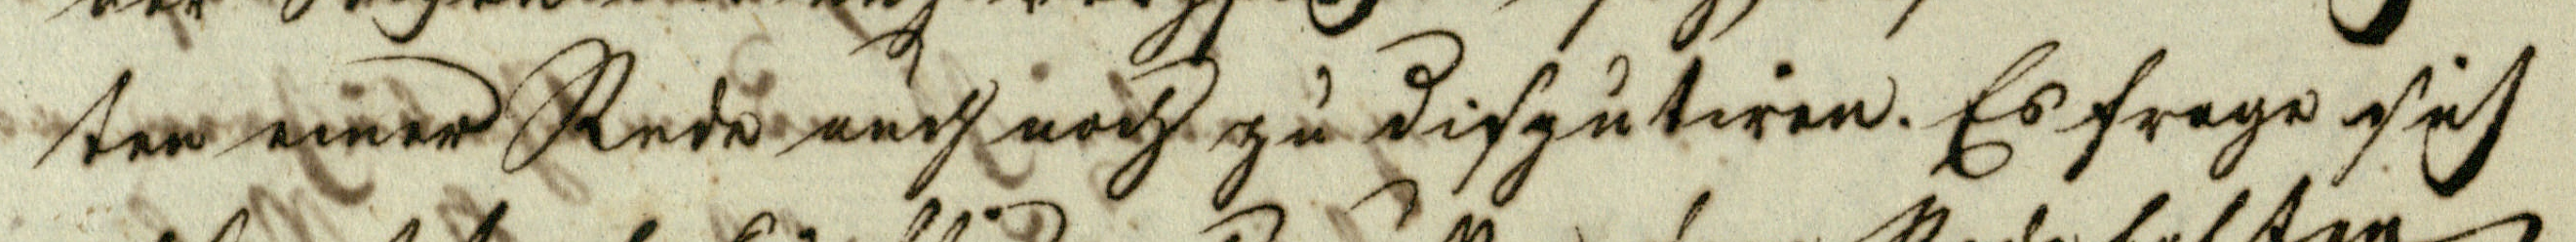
ten einer Rede auch noch zu disputiren. Es frage sich
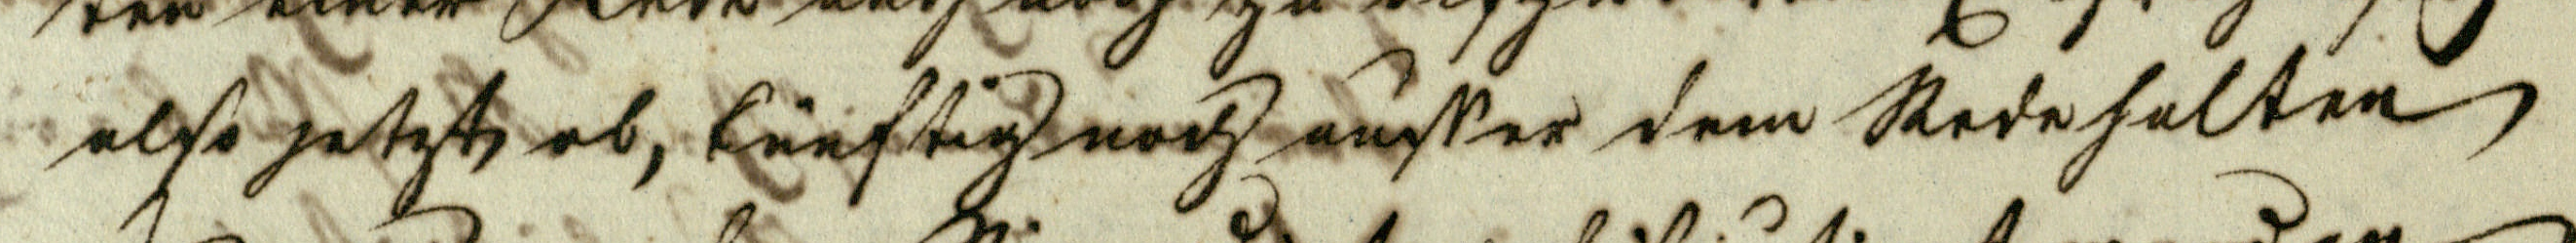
also jetzt ob, künftig noch ausser dem Redehalten
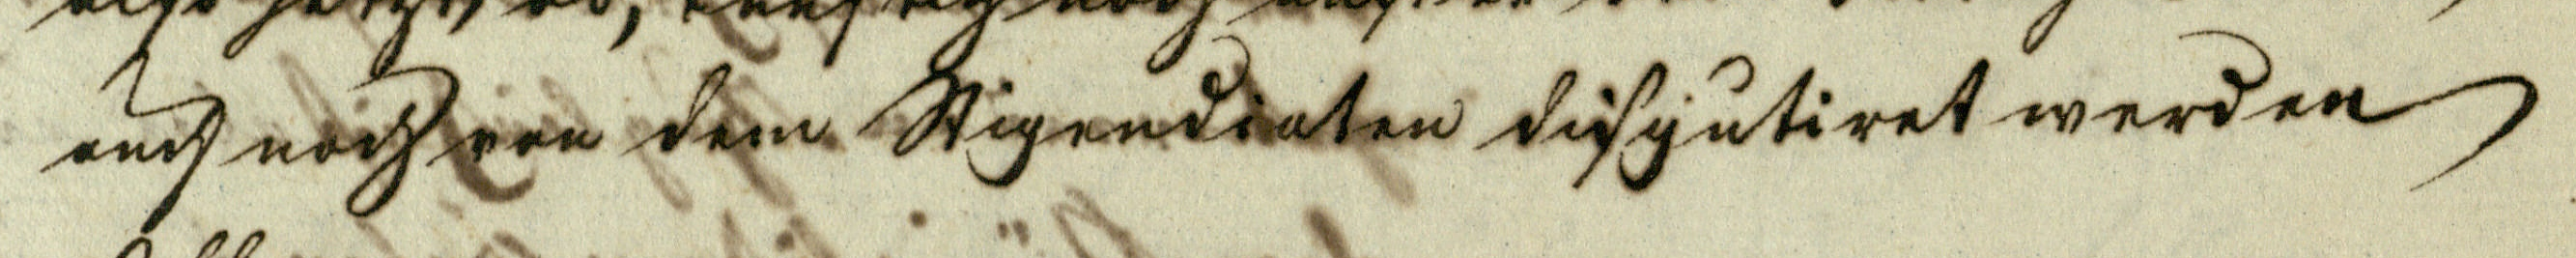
auch noch von dem Stipendiaten disputiret werden
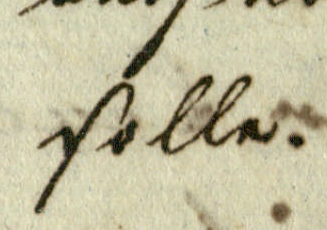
solle.
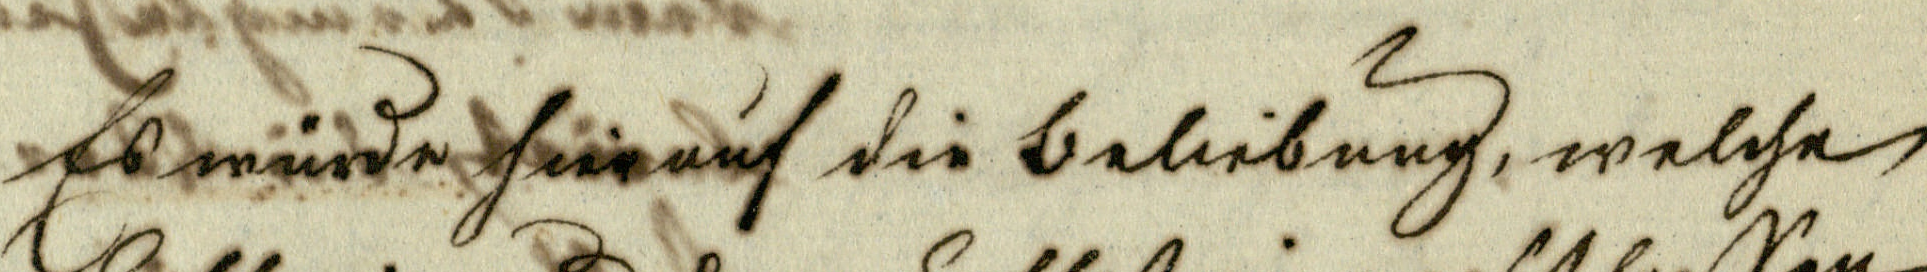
Es wird hierauf die Beliebung, welche
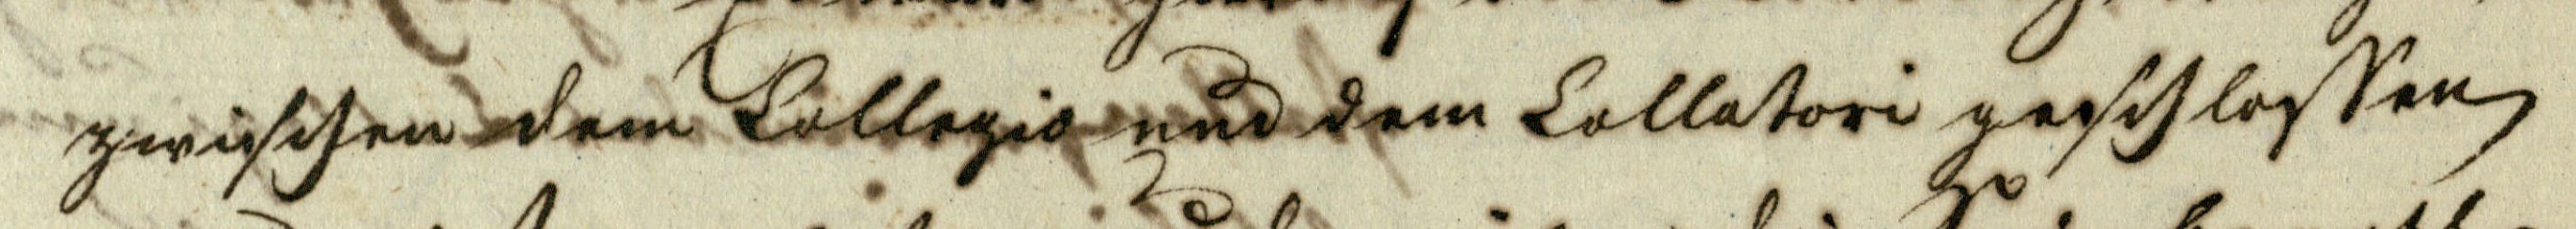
zwischen dem Collegio und dem Collatori geschlossen
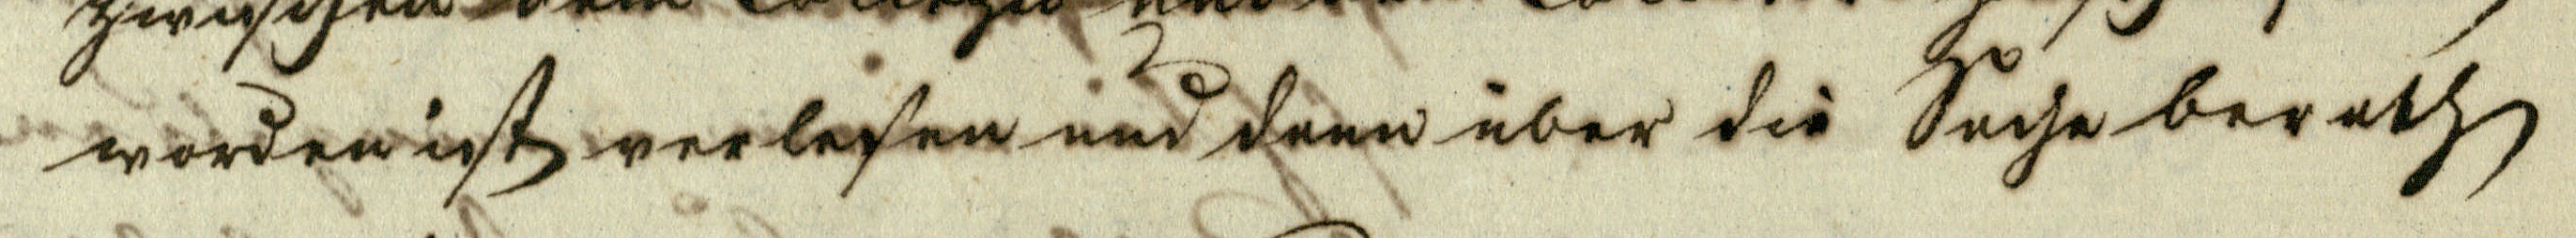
worden ist, verlesen und dann über die Sache berath¬
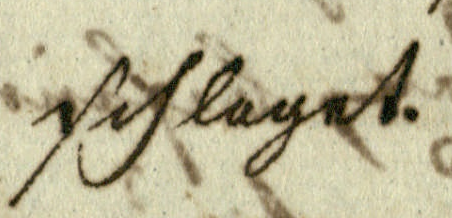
schlaget.
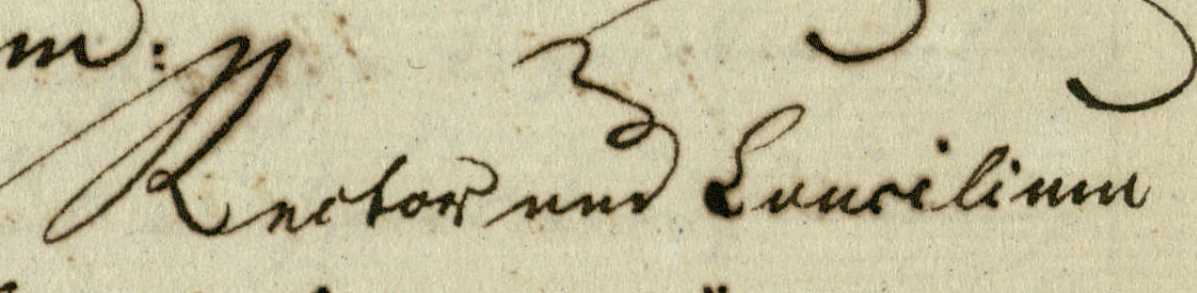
Rector und Concilium
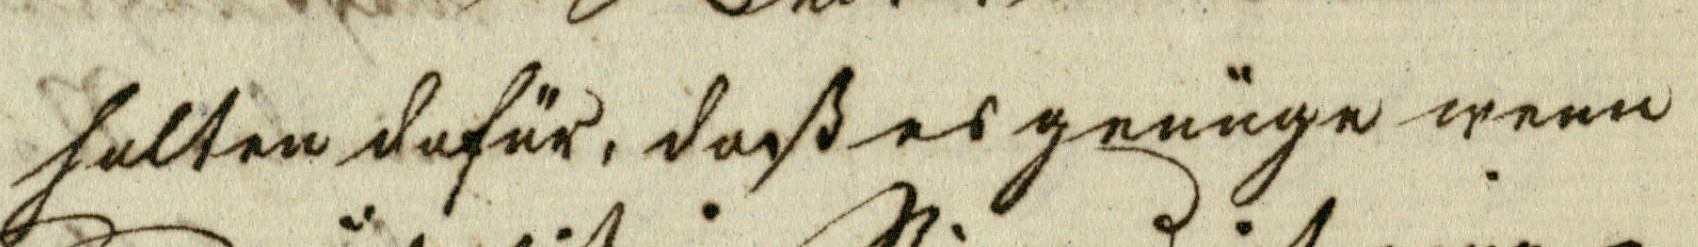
halten dafür, daß es genüge wenn
